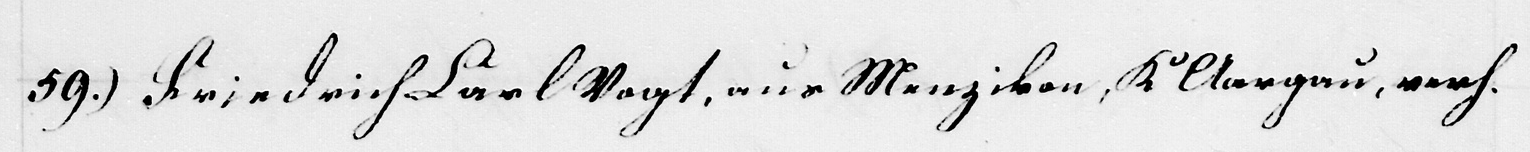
59.) Friedrich Carl Vogt, aus Menzikon, K Aargau, verh.
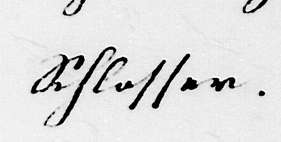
Schlosser.
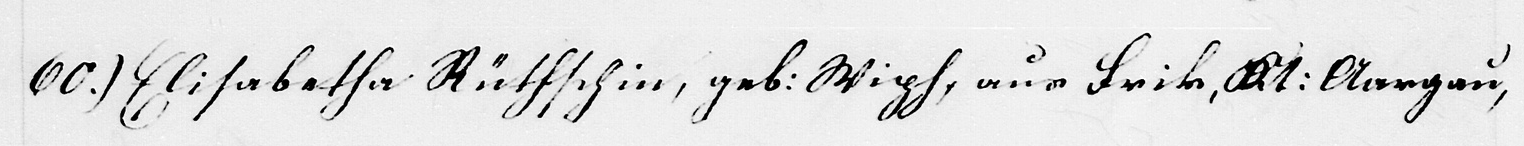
60.) Elisabetha Rüthschin, geb: Wipf, aus Frik, Kt: Aargau,
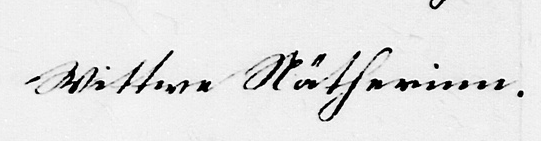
Wittwe Nätherinn.
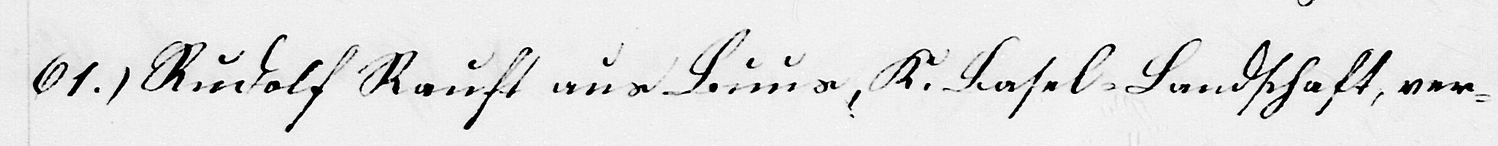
61.) Rudolf Rauft aus Buus, K. Basel-Landschaft, ver¬
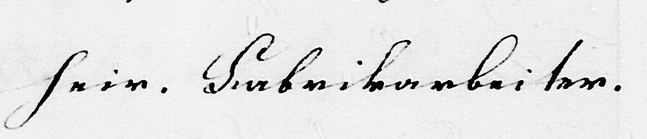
heir. Fabrikarbeiter.
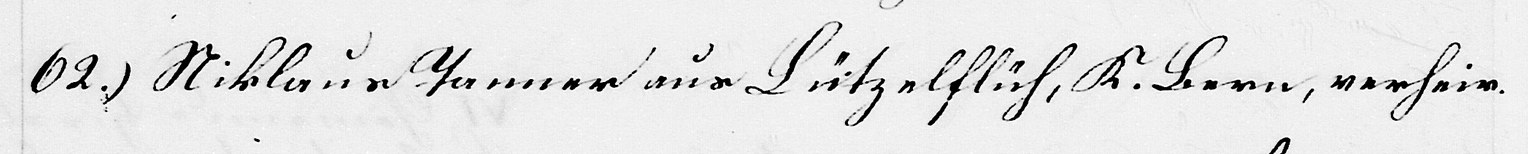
62.) Niklaus Tanner aus Lützelflüh, K. Bern, verheir.
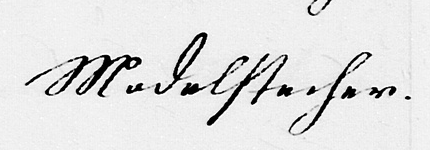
Modelstecher.
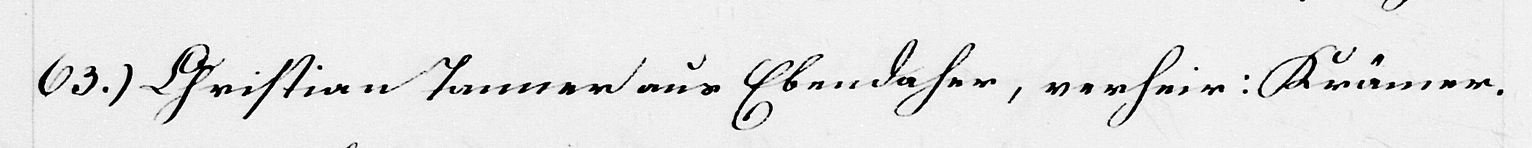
63.) Christian Tanner aus Ebendaher, verheir: Krämer.
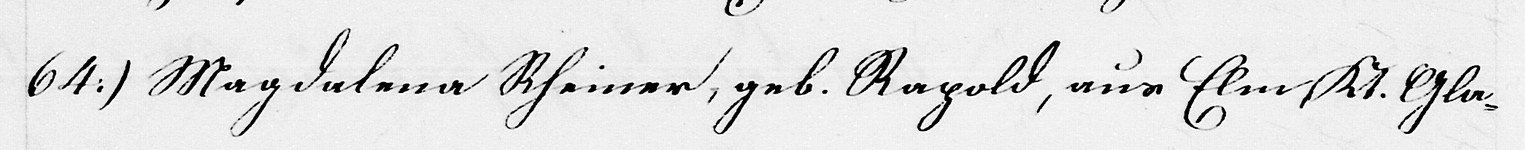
64.) Magdalena Rheiner, geb. Rapold, aus Elm, Kt. Gla¬
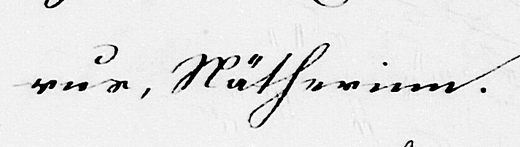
rus, Nätherinn.
